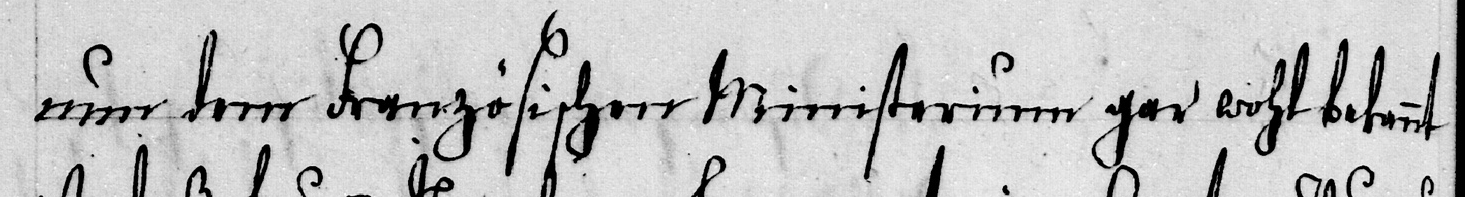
nun dem Französischen Ministerium gar wohl bekan¬
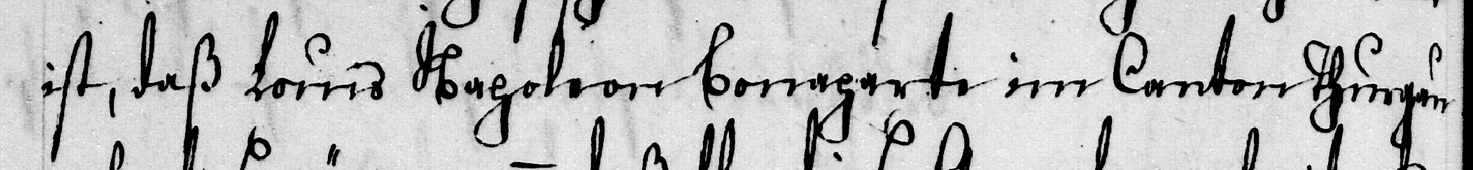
ist, daß Louis Napoleon Bonaparte im Canton Thurgau
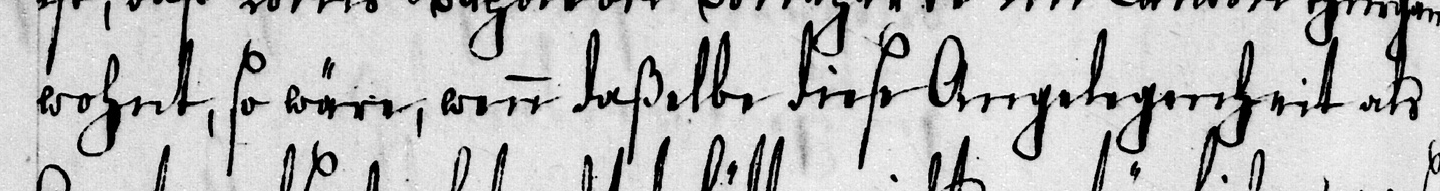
wohnt, so wäre, wenn daßelbe diese Angelegenheit als
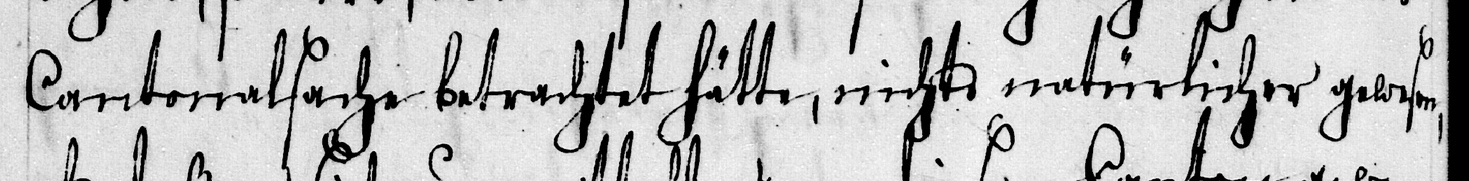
Cantonalsache betrachtet hätte, nichts natürlicher gewe¬
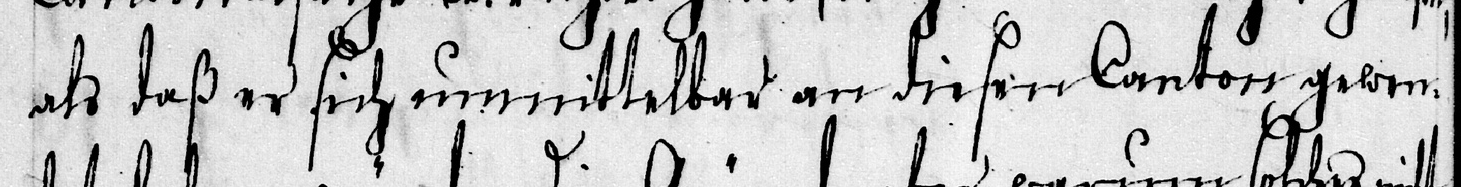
als daß er sich unmittelbar an diesen Canton gewen¬
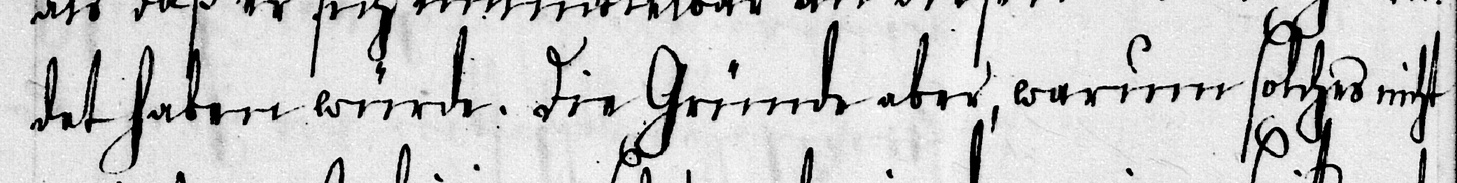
det haben würde. Die Gründe aber, warum solches nic¬
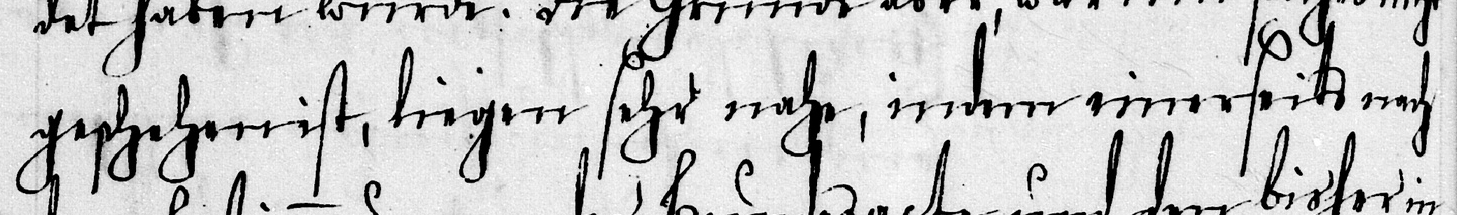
geschehen ist, liegen sehr nahe, indem einerseits nach
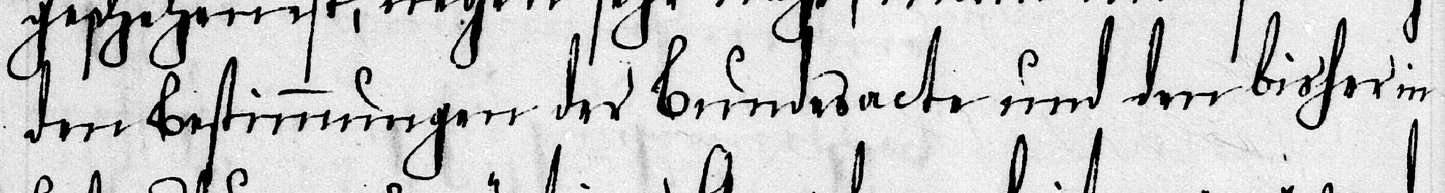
den Bestimmungen der Bundesacte und den bisher in
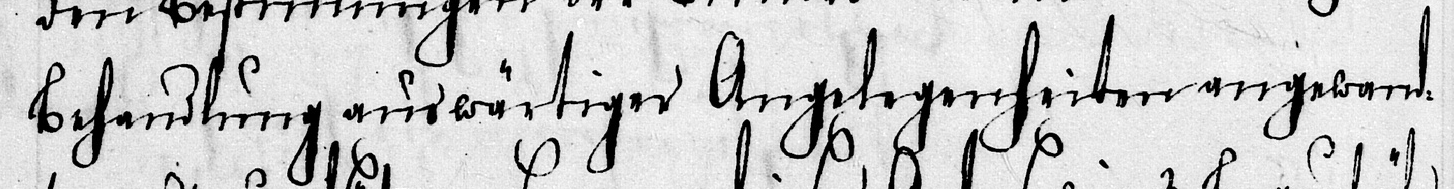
Behandlung auswärtiger Angelegenheiten angewand¬
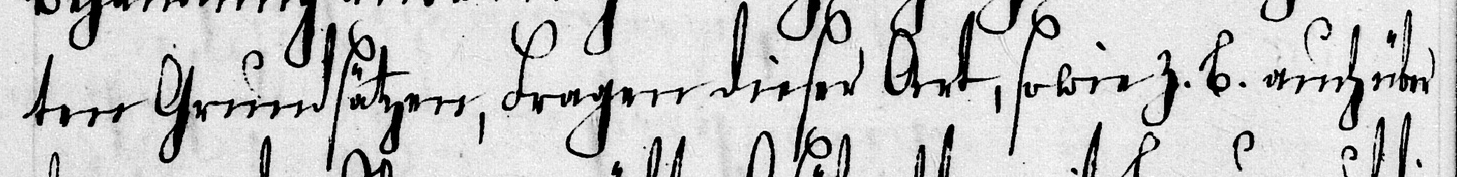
ten Grundsätzen, Fragen dieser Art, sowie z. B. auch über
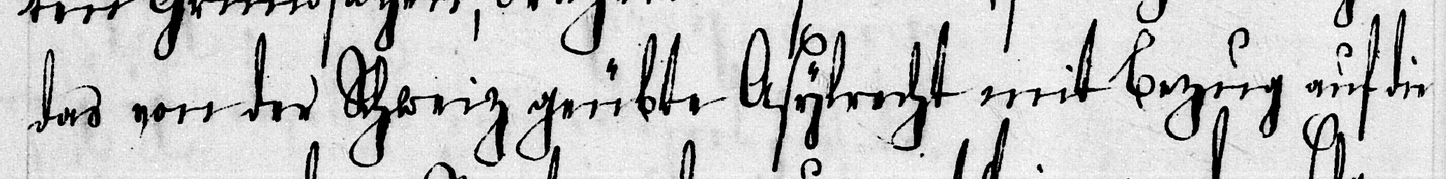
das von der Schweiz geübte Asylrecht mit Bezug auf die
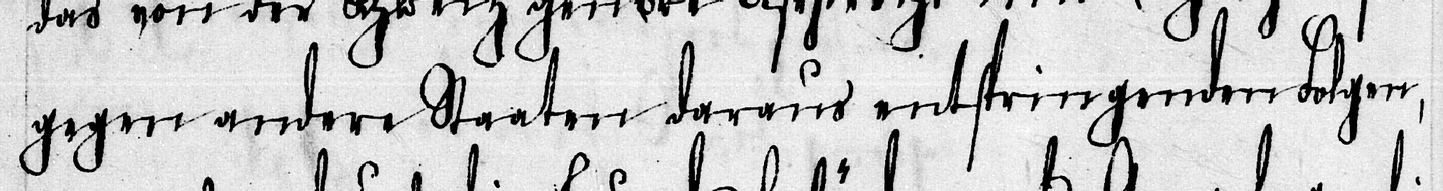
gegen andere Staaten daraus entspringenden Folgen,
